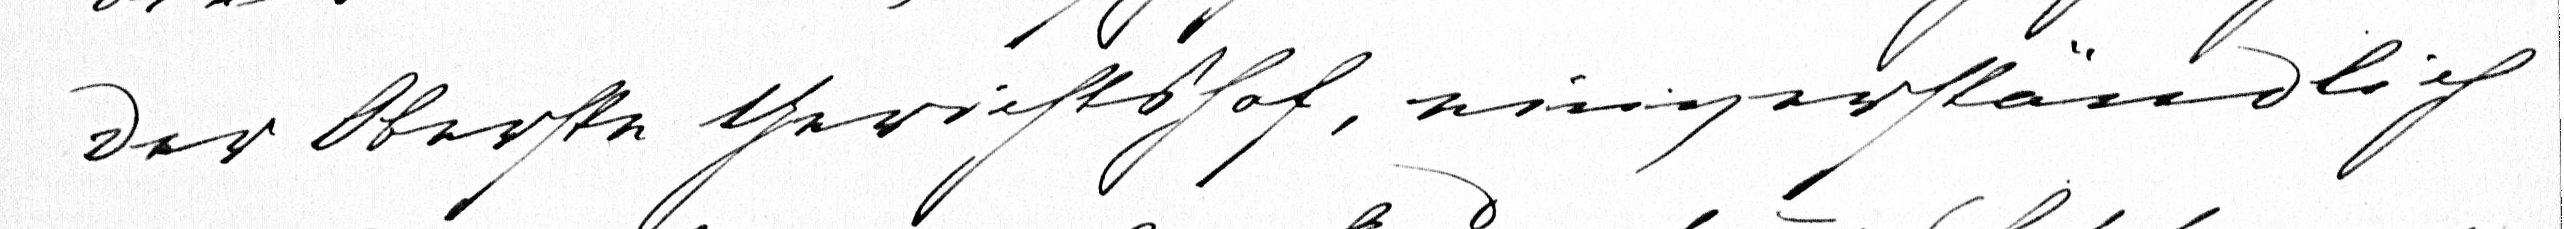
der Oberste Gerichtshof, einverständlich
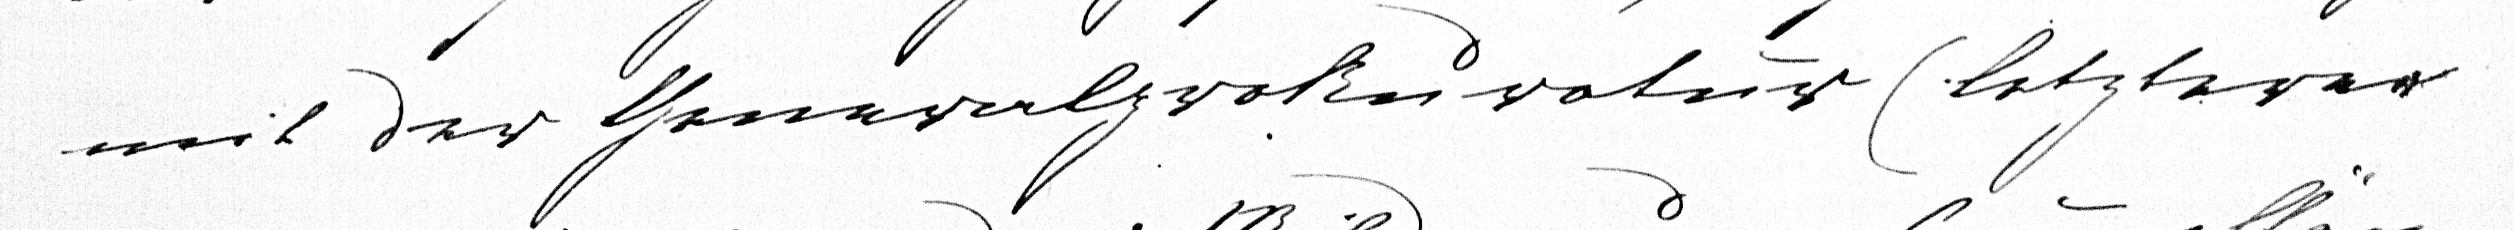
mit der Generalprokuratur (letzterer
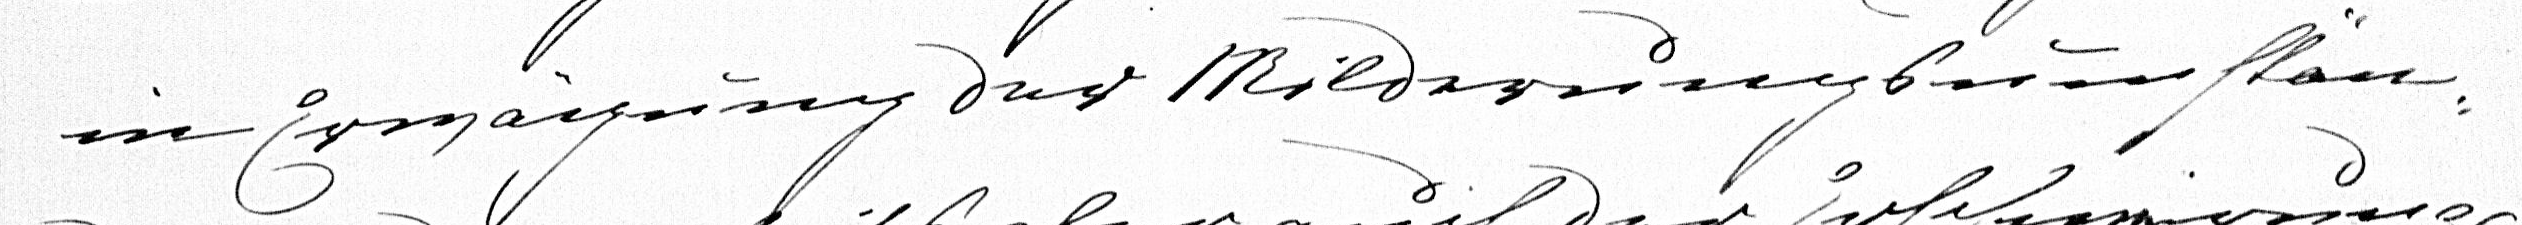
in Erwägung der Milderungsumstän¬
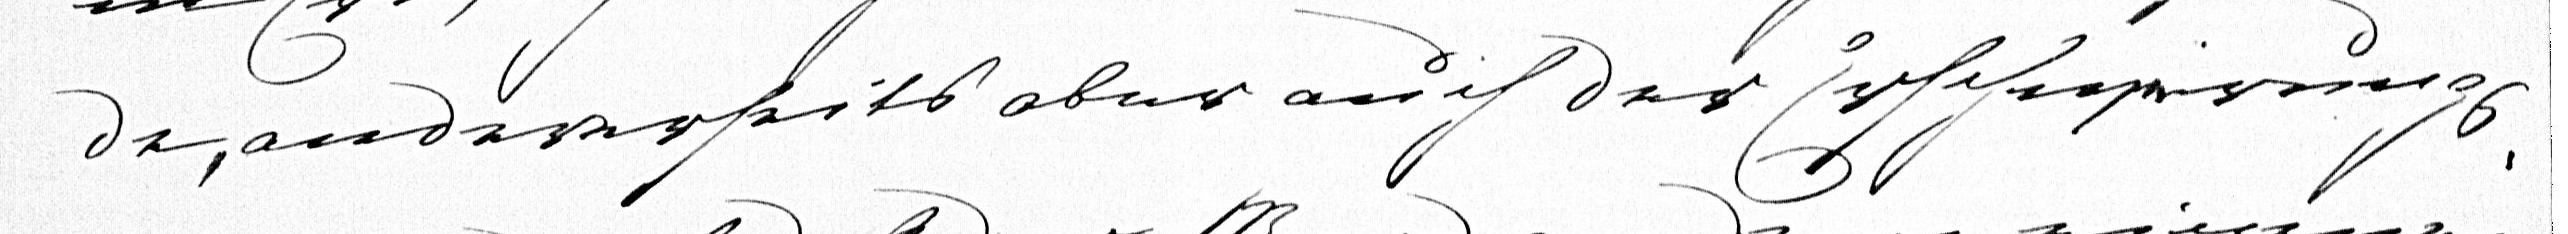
de, andererseits aber auch der Erschwerungs¬
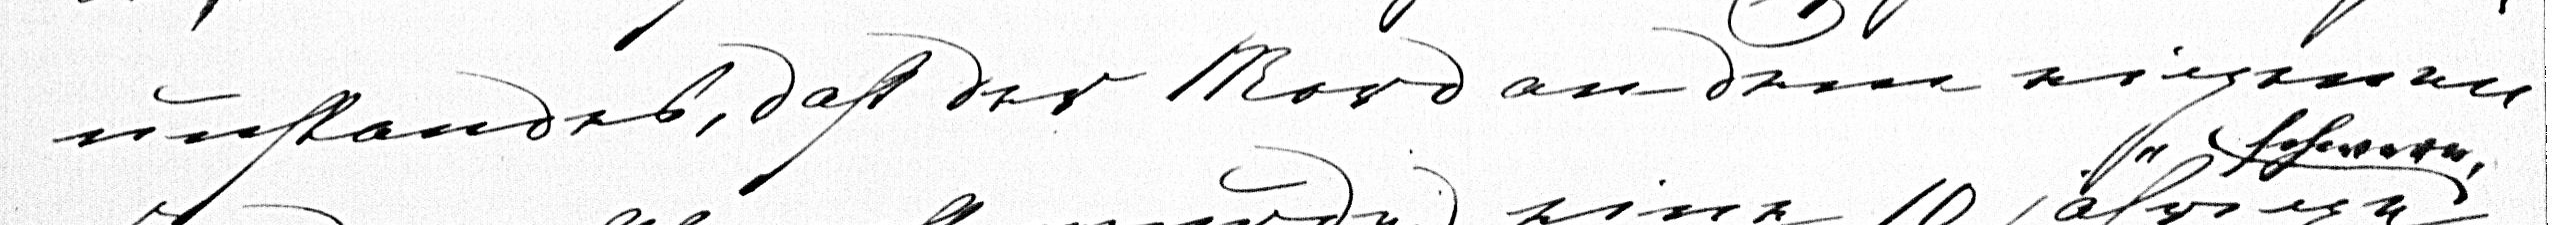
unstandes, daß der Mord an dem eigenen
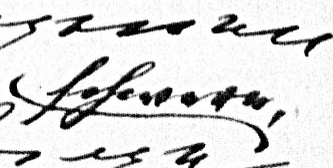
schwere,
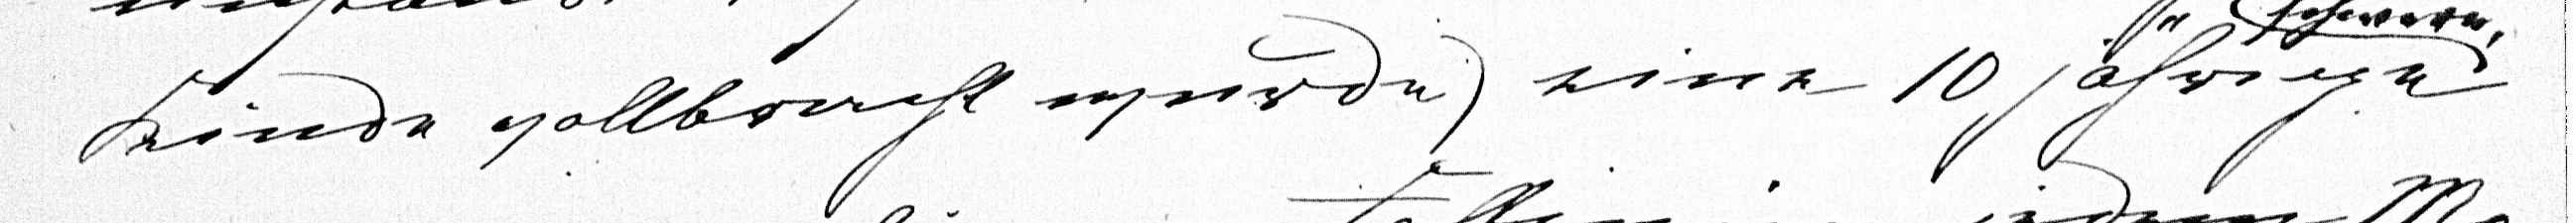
Kinde vollbracht wurde) eine 10 jährige
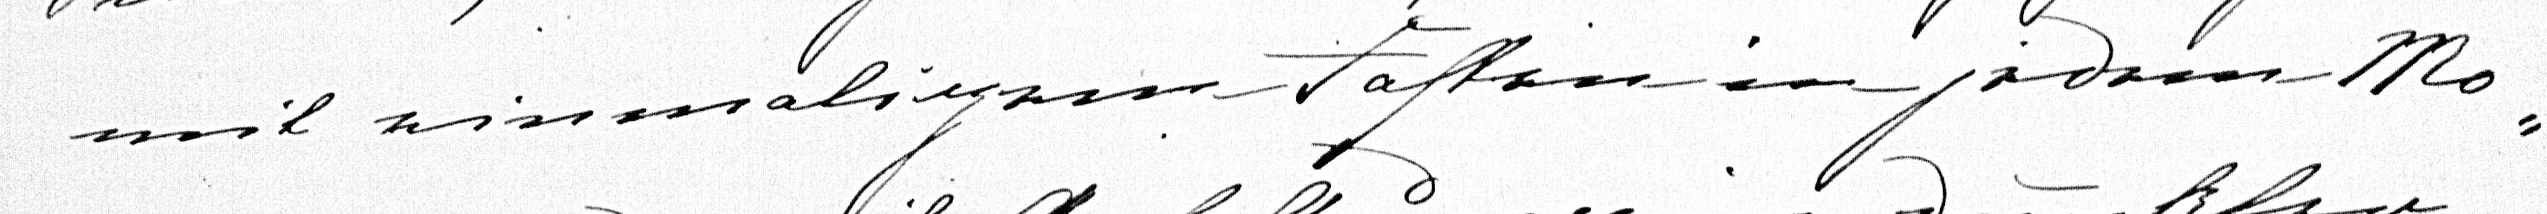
mit einmaligem Fasten in jedem Mo¬
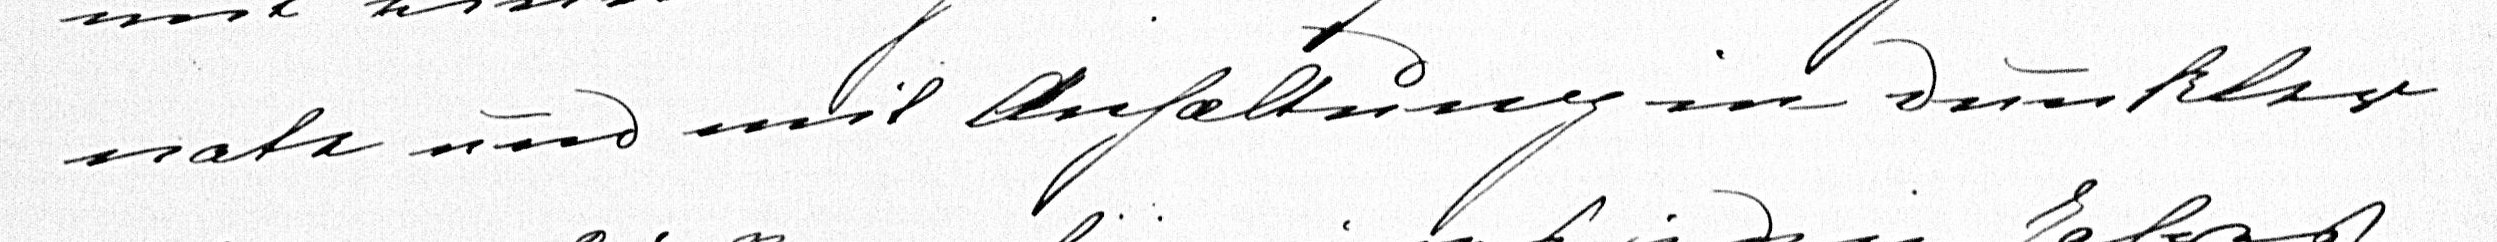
nate und mit Anhaltung in Dunkler
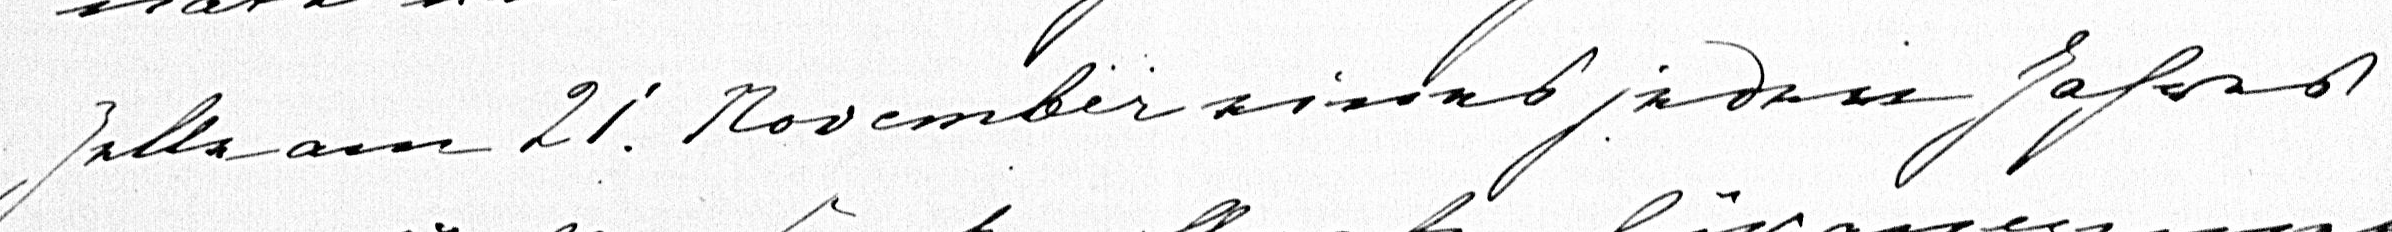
Zelle am 21. November eines jeden Jahres
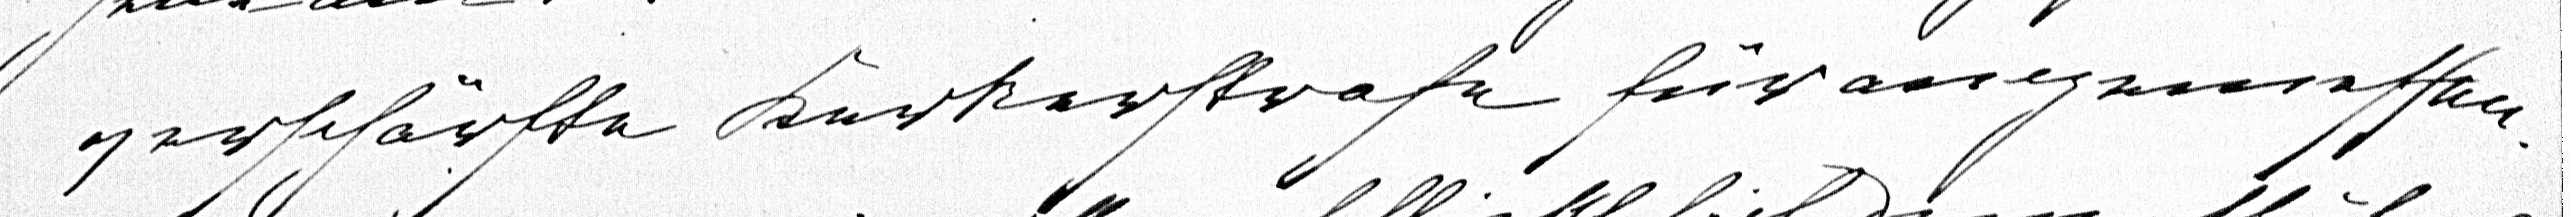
verschärfte Kerkerstrafe für angemessen.
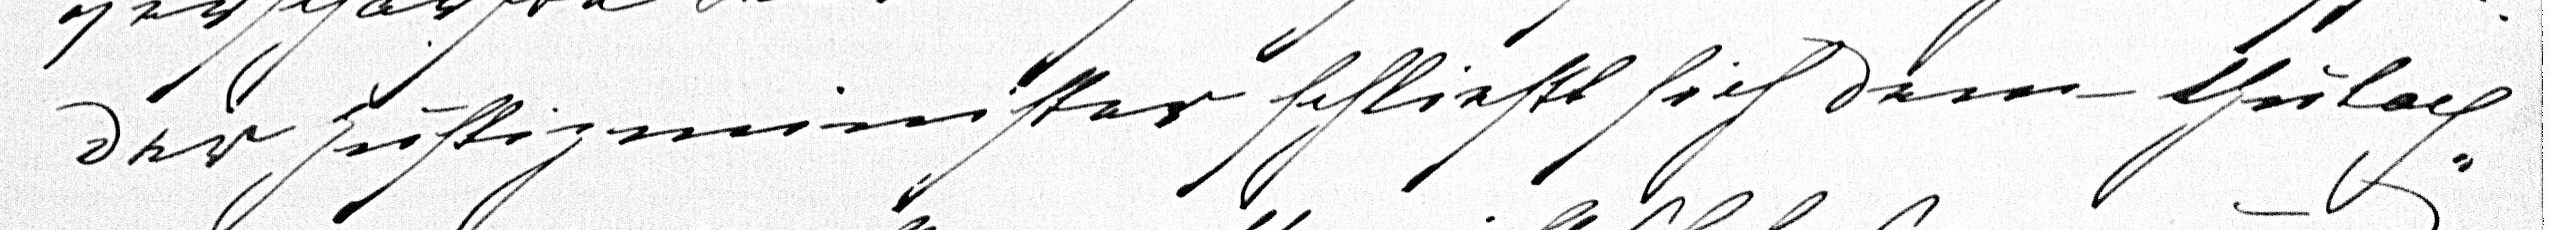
Der Justizminister schließt sich dem Gutach¬
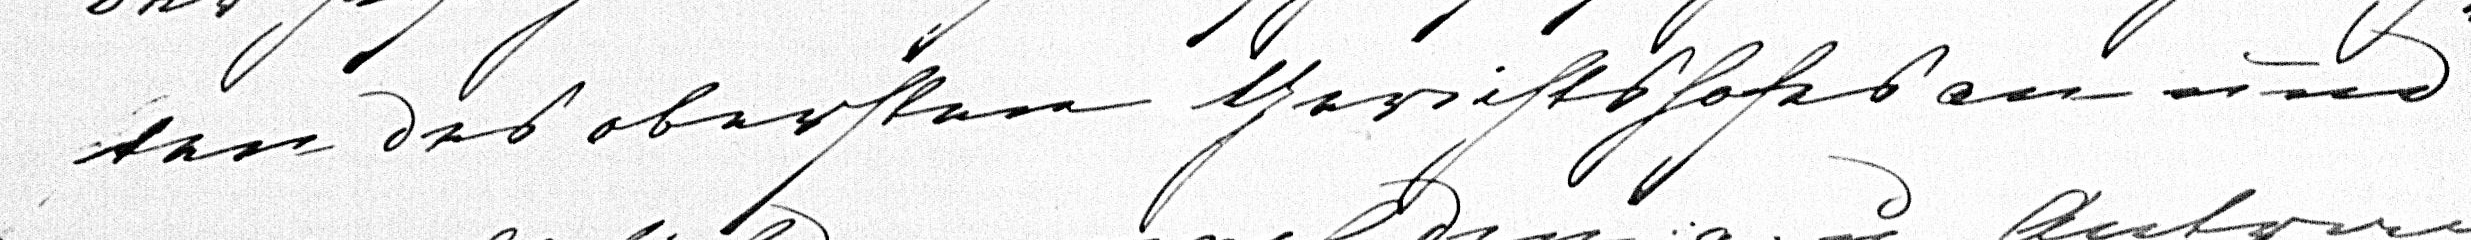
ten des obersten Gerichtshofes an und
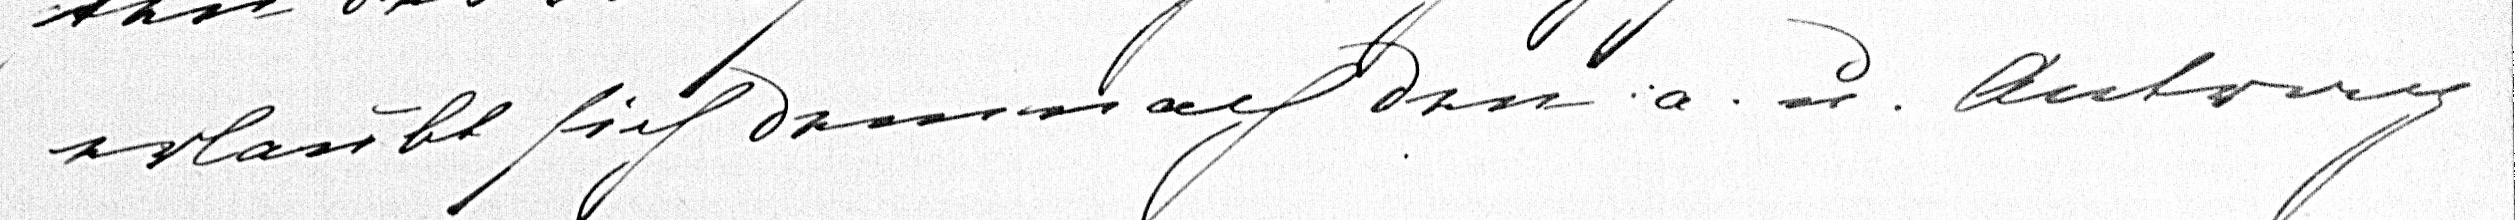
erlaubt sich dem nach den a. u. Antrag
